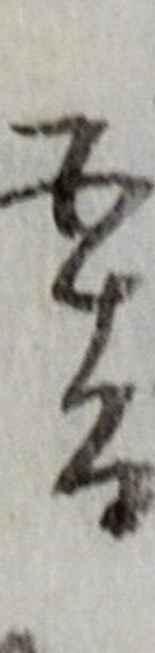五十間
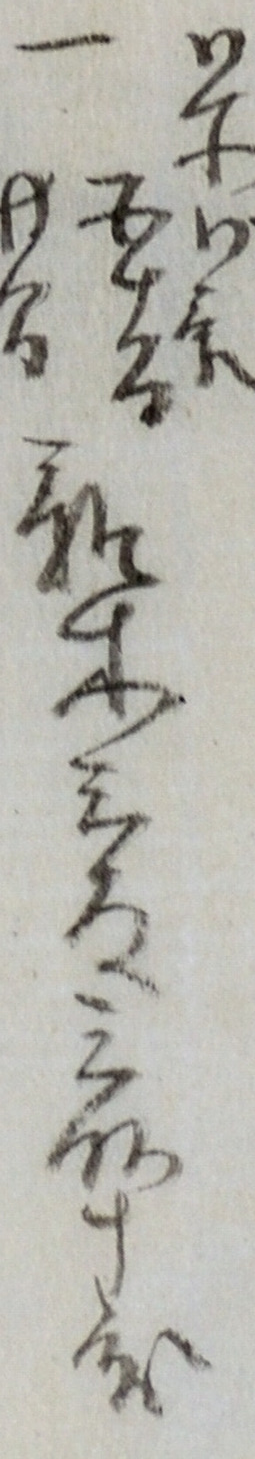一五十間雑木林三反三畝十歩
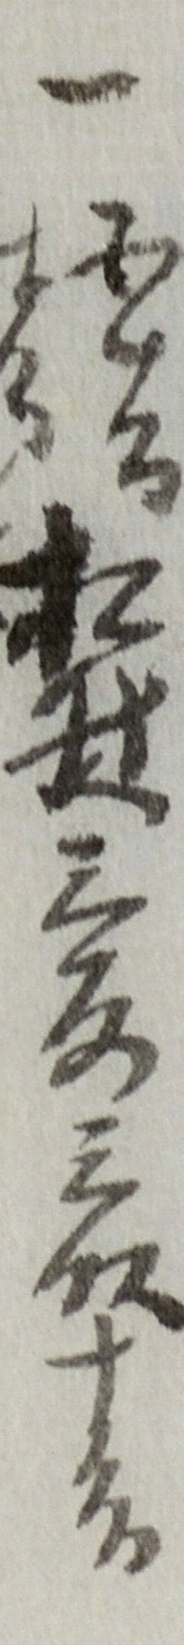一五十間松林三反三畝十歩
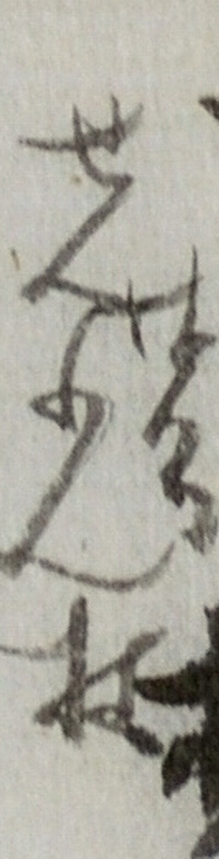せん尓ん同
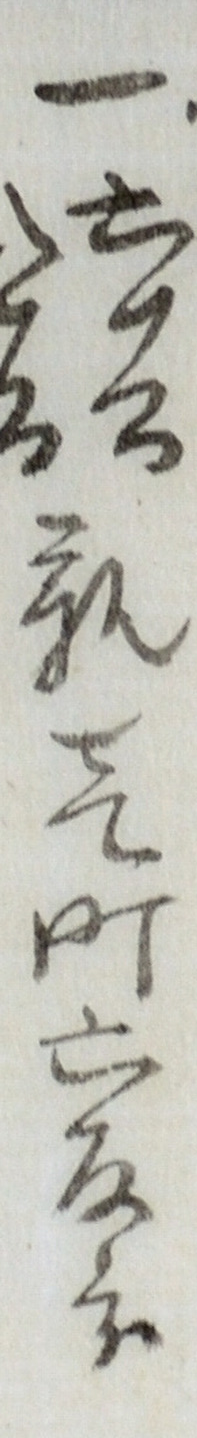一六十間雑壱町六反ほ
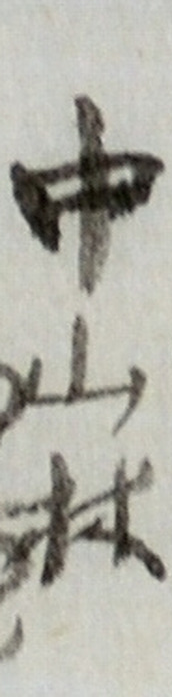中山村
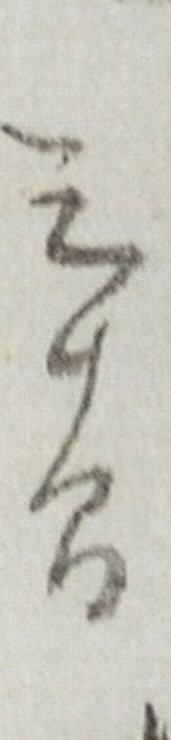三十間
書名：中澤郷御林控
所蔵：伊那市立高遠町図書館・合同会社AMANE
